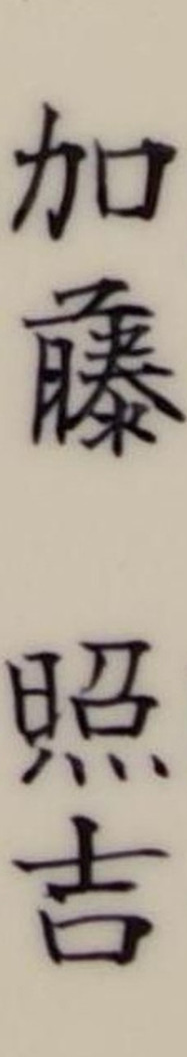加藤照吉
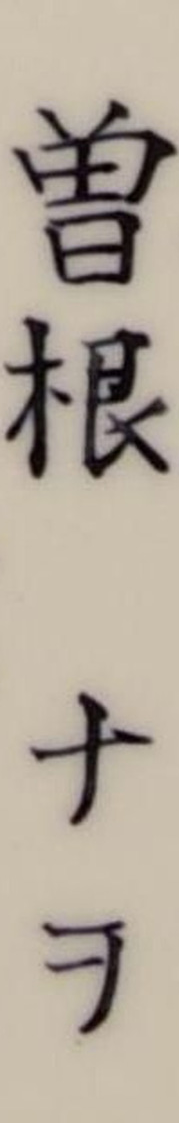曽根ナヲ
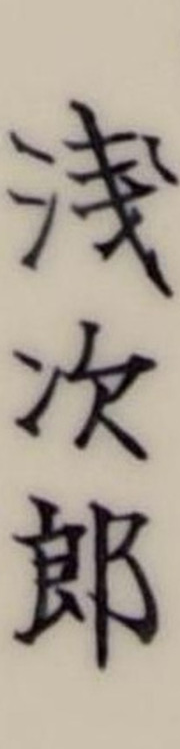浅次郎
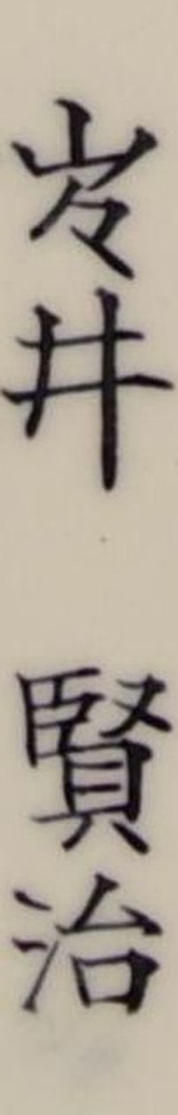㞮井賢治
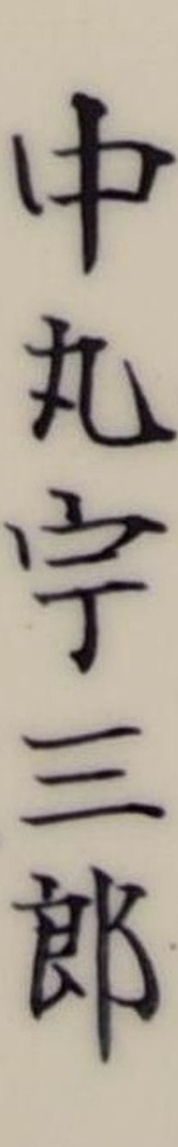中丸宇三郎
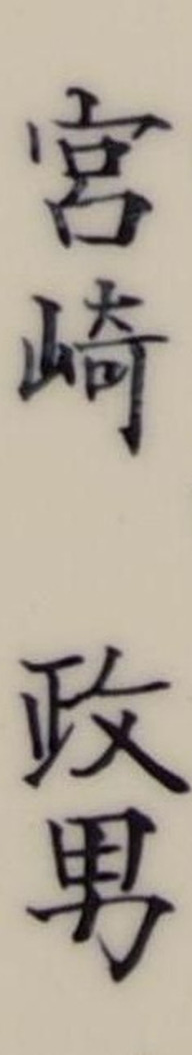宮崎政男
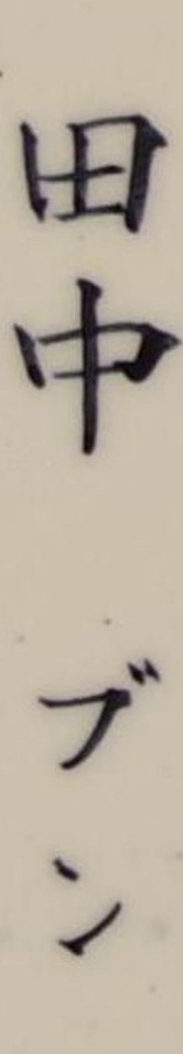田中ブン
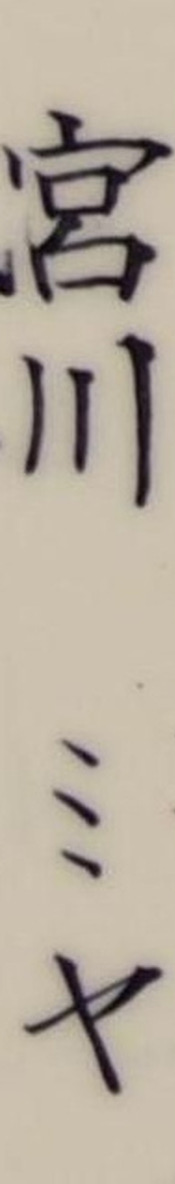宮川ミヤ
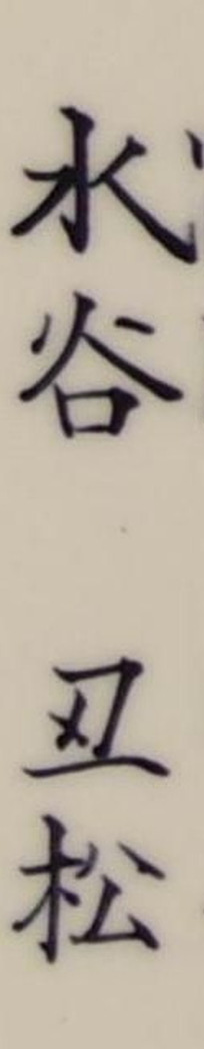水谷丑松
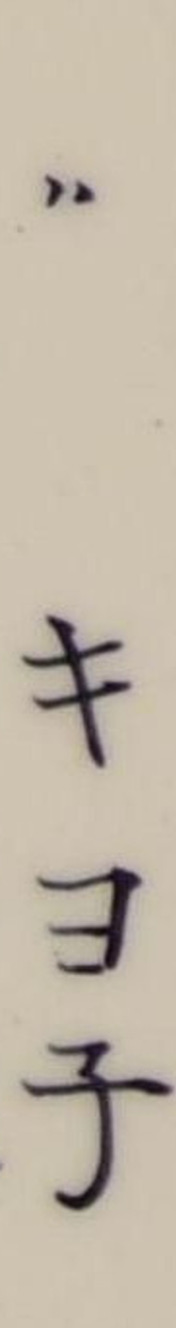キヨ子
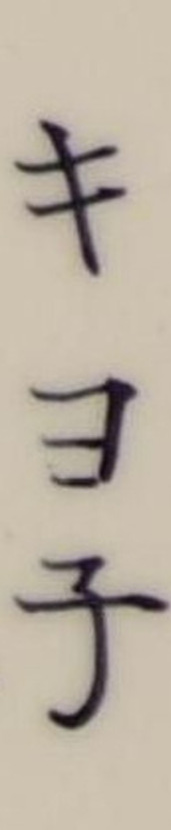キヨ子
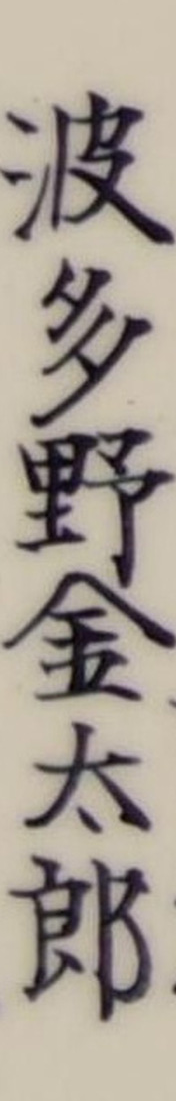波多野金太郎
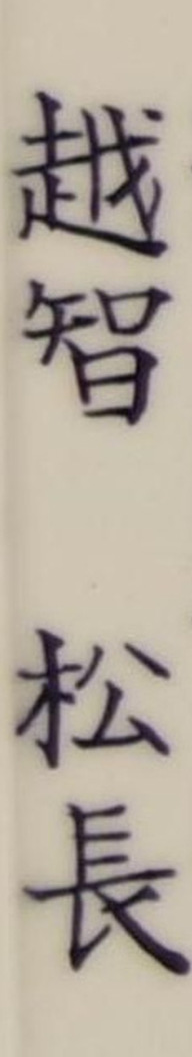越智松長

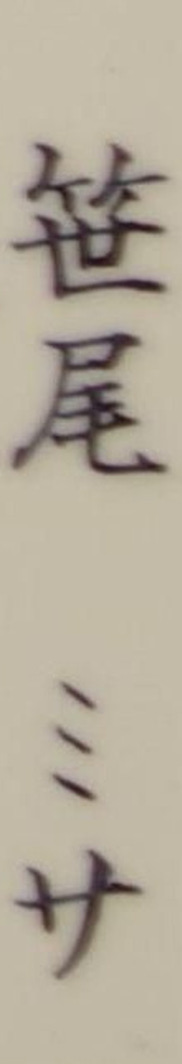笹尾ミサ
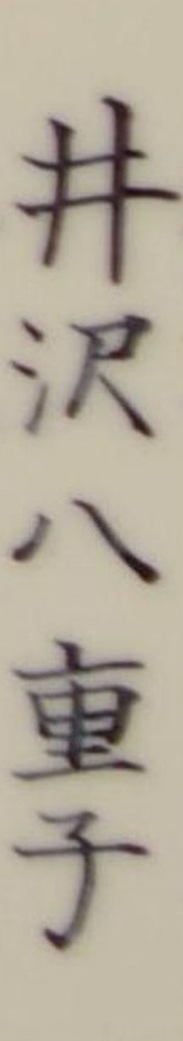井沢八重子
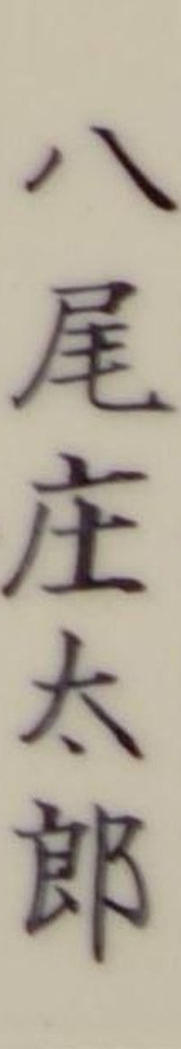八尾庄太郎
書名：M~S
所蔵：高野山金剛峯寺
